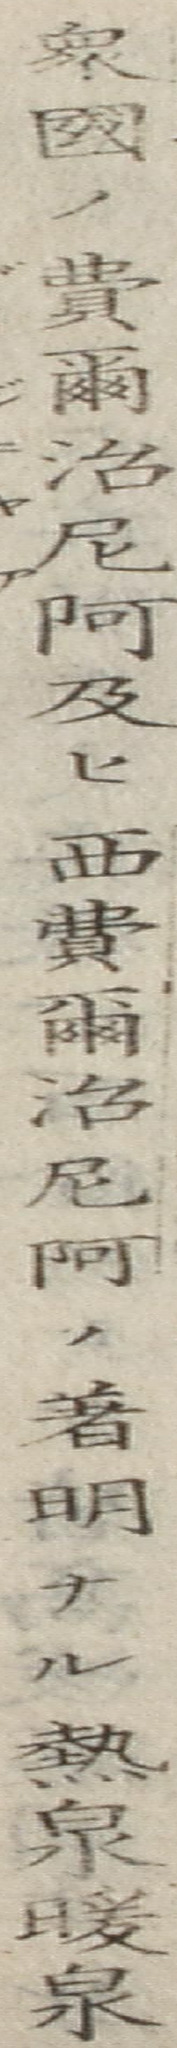衆国ノ費爾治尼阿及ヒ西費爾治尼阿ノ著明ナル熱泉暖泉
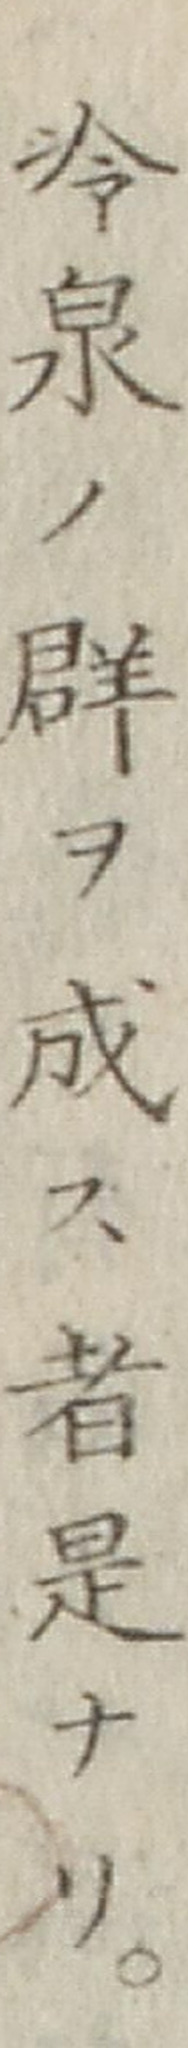冷泉ノ群ヲ成ス者是ナリ。
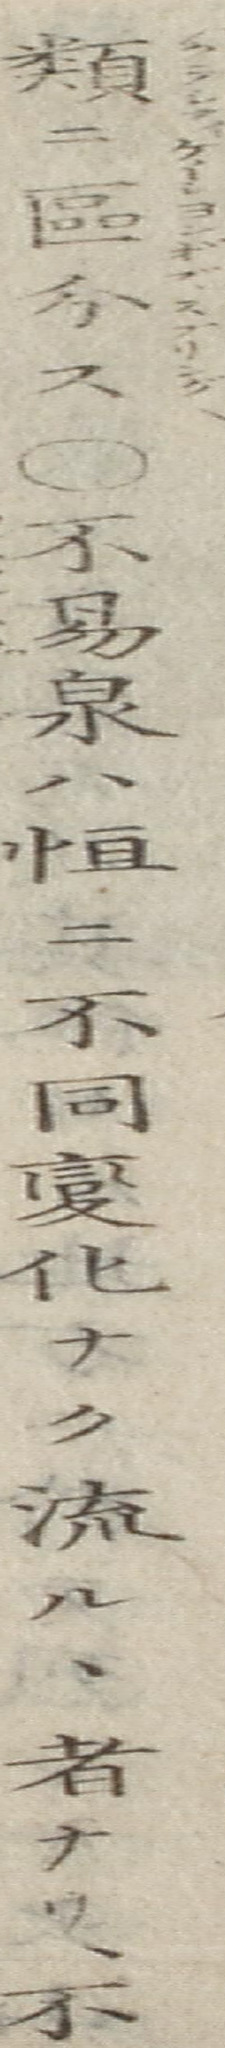類ニ区分ス○不易泉ハ恒ニ不同変化ナク流ルヽ者ナリ、不
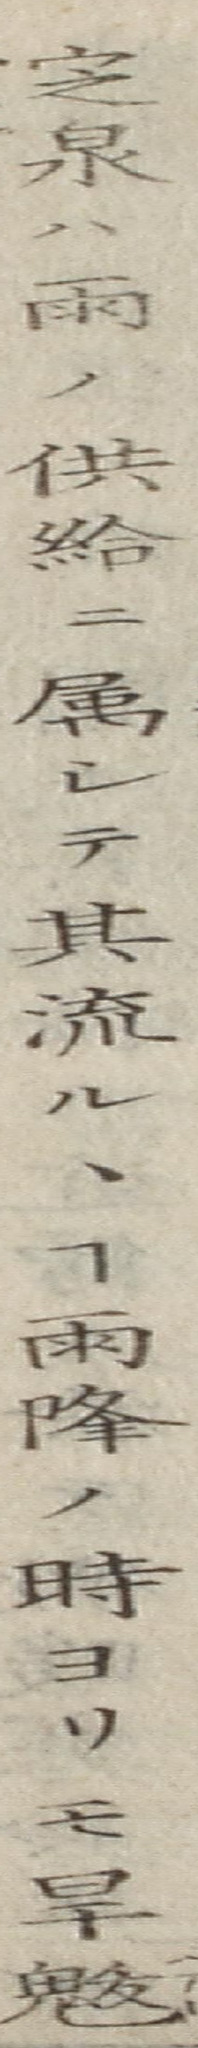定泉ハ雨ノ供給ニ属シテ其流ルヽヿ雨隆ノ時ヨリモ旱魃
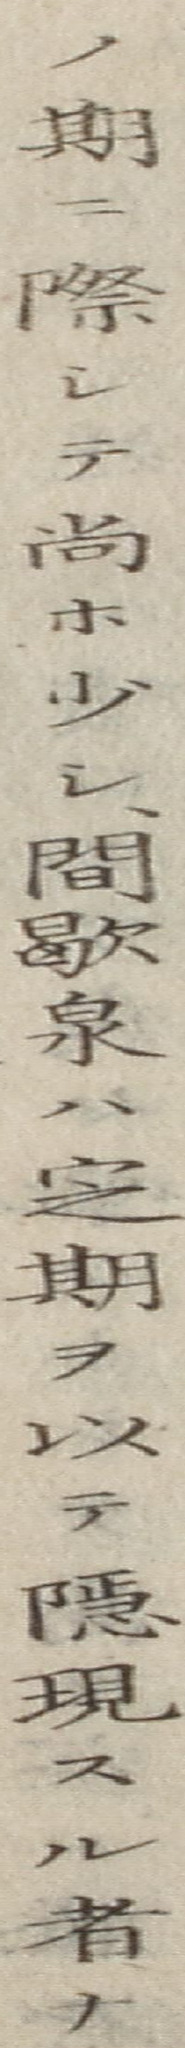ノ期ニ際シテ尚ホ少シ、間歇泉ハ定期ヲ以テ隠現スル者ナ
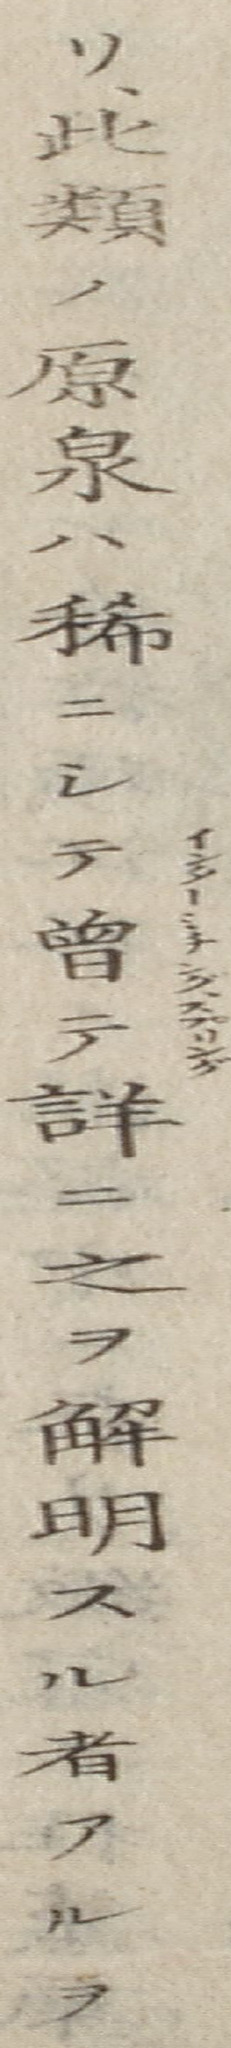リ、此類ノ原泉ハ稀ニシテ曾テ詳ニ之ヲ解明スル者アルヲ
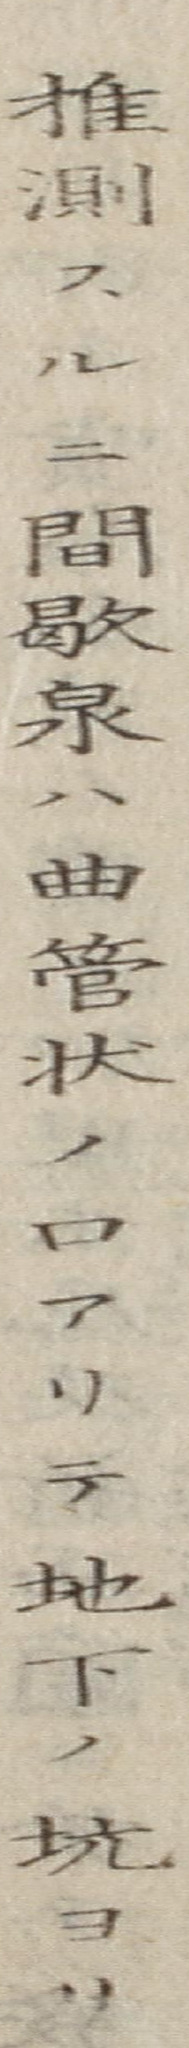推測スルニ間歇泉ハ曲管状ノ口アリテ地下ノ坑ヨリ
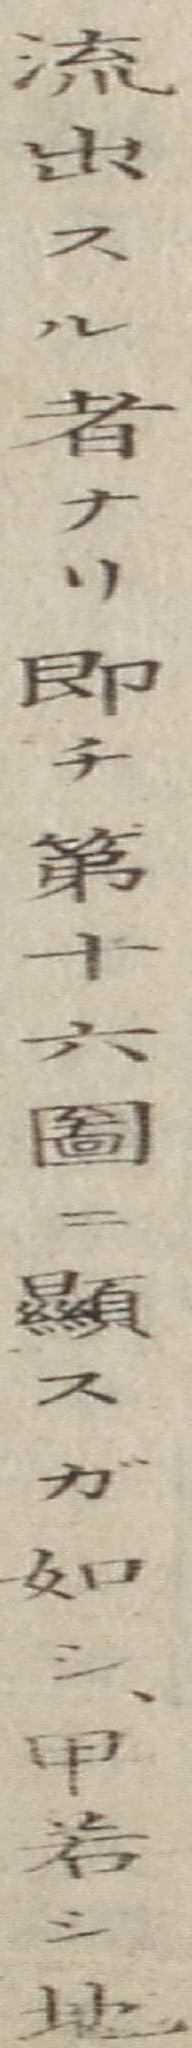流出スル者ナリ即チ第十六図ニ顕スガ如シ、甲若シ地
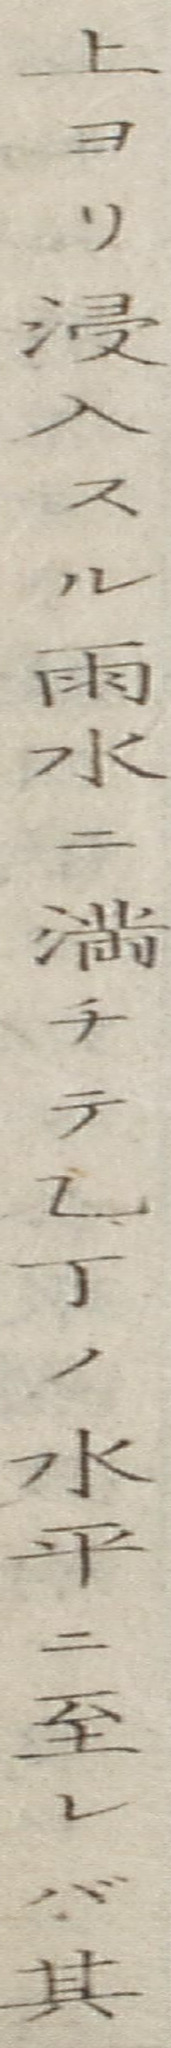上ヨリ浸入スル雨水ニ満チテ乙丁ノ水平ニ至レバ其
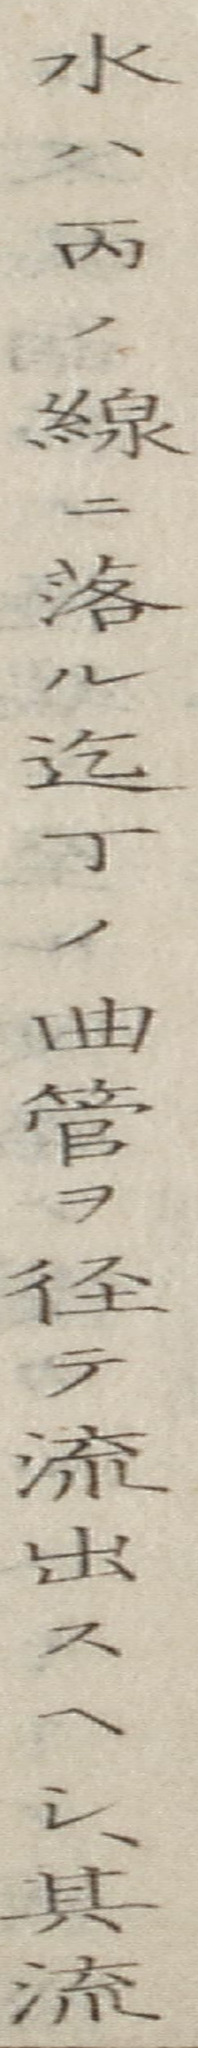水ハ丙ノ線ニ落ル迄丁ノ曲管ヲ径テ流出スヘシ、其流
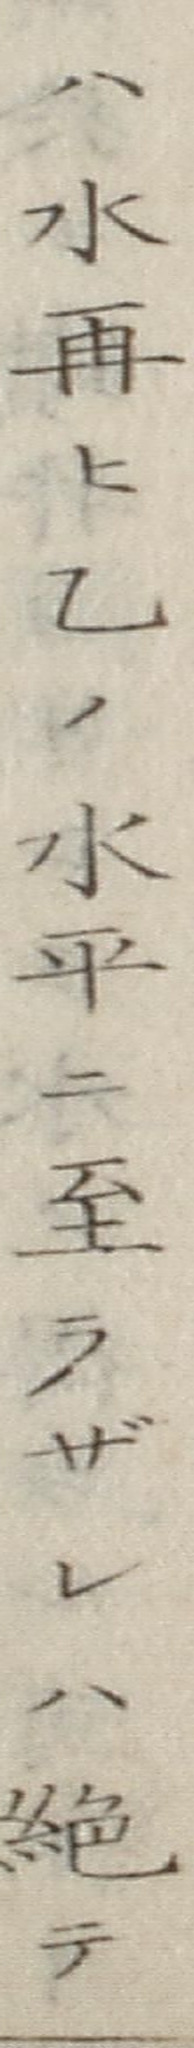ハ水再ヒ乙ノ水平ニ至ラザレハ絶テ
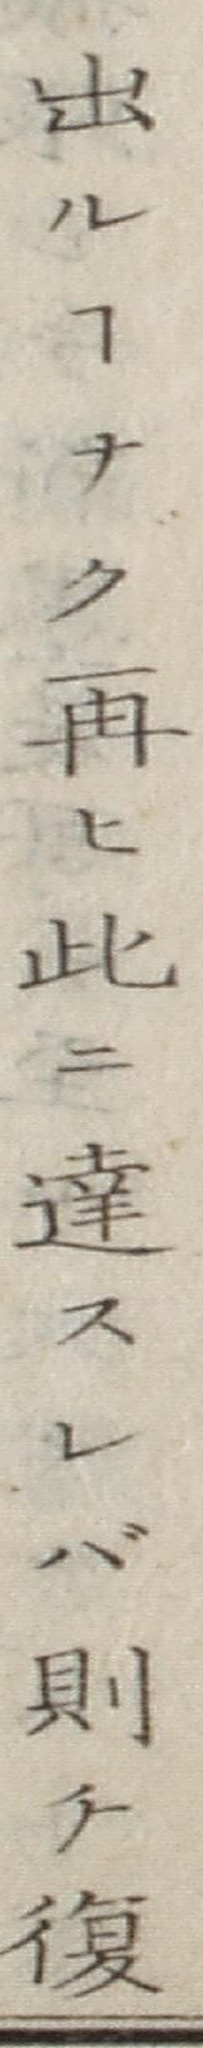出ルヿナク再ヒ此ニ達スレバ則チ復
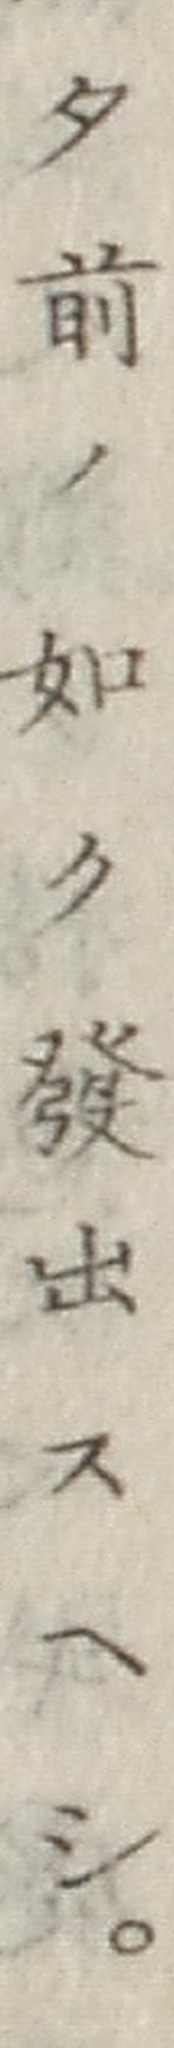タ前ノ如ク発出スヘシ。
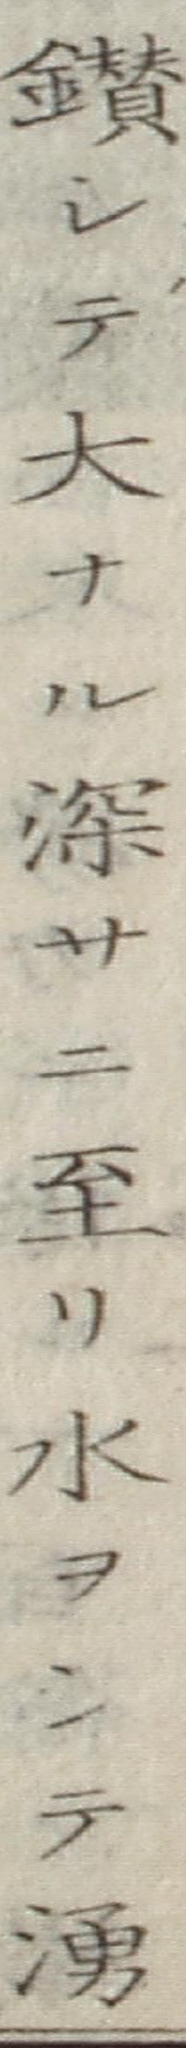鑚シテ大ナル深サニ至リ水ヲシテ湧
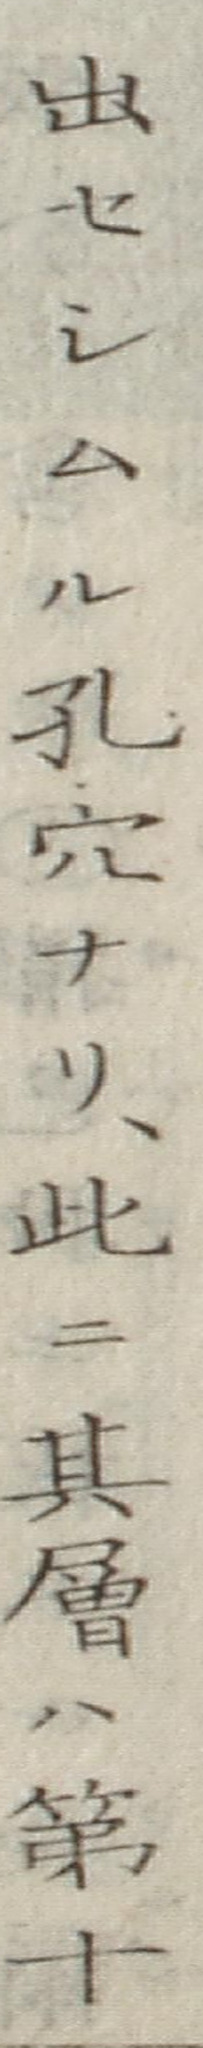出セシムル孔穴ナリ、此ニ其層ハ第十
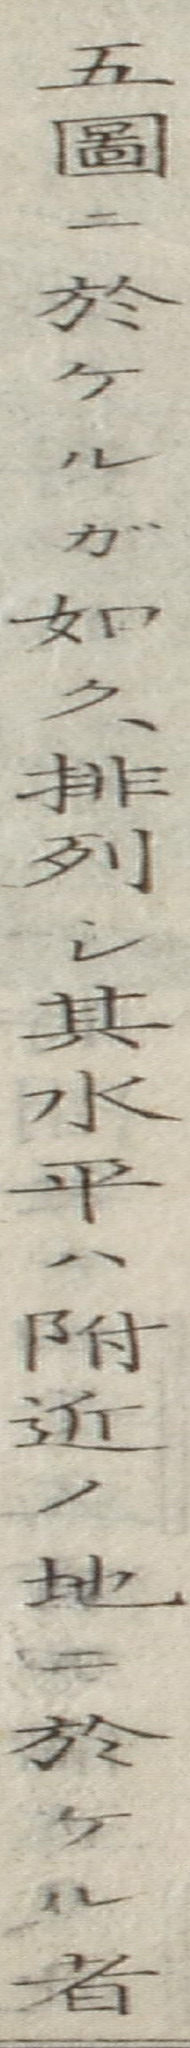五図ニ於ケルガ如ク、排列シ其水平ハ附近ノ地ニ於ケル者
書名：地形論　巻二
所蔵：東京大学地震研究所図書室 Earthquake Research Institute Library, The University of Tokyo, JAPAN
